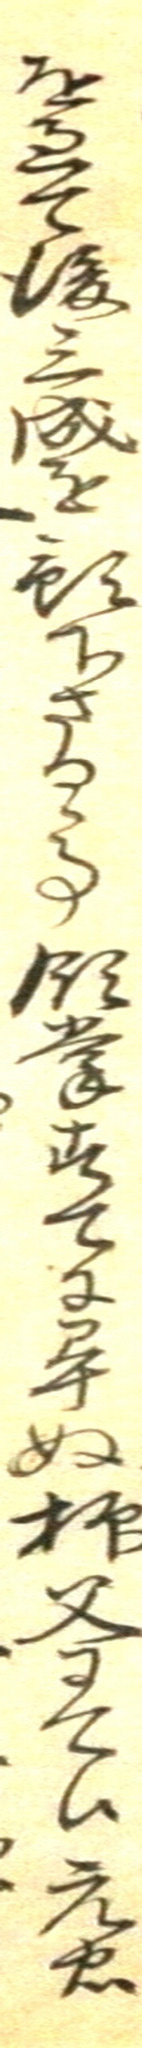を過て後三成を預下さるゝ事領掌すてに畢ぬ抑父にて候元忠
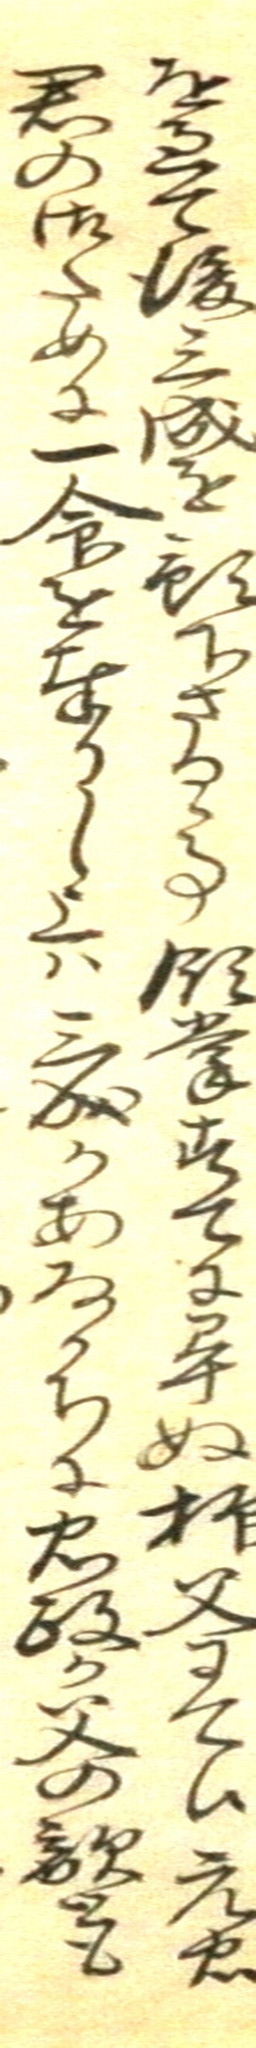君の御ために一命を奉りし上は三成かあなかちに忠政か父の敵とも
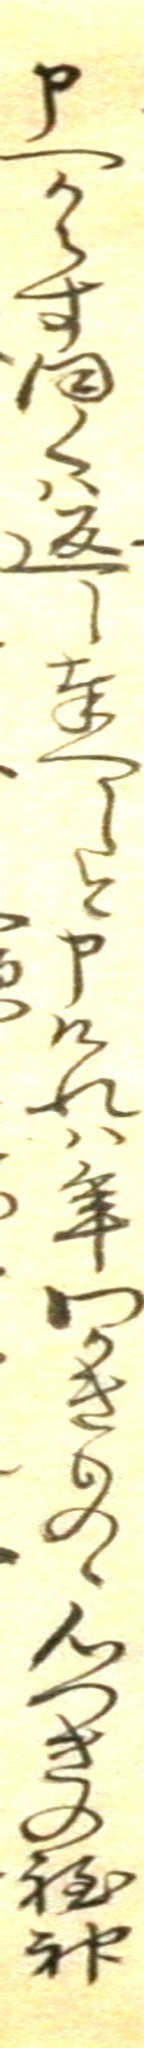申へからす同くは返し奉へしと申けれは年わかきものゝ心つきの程神
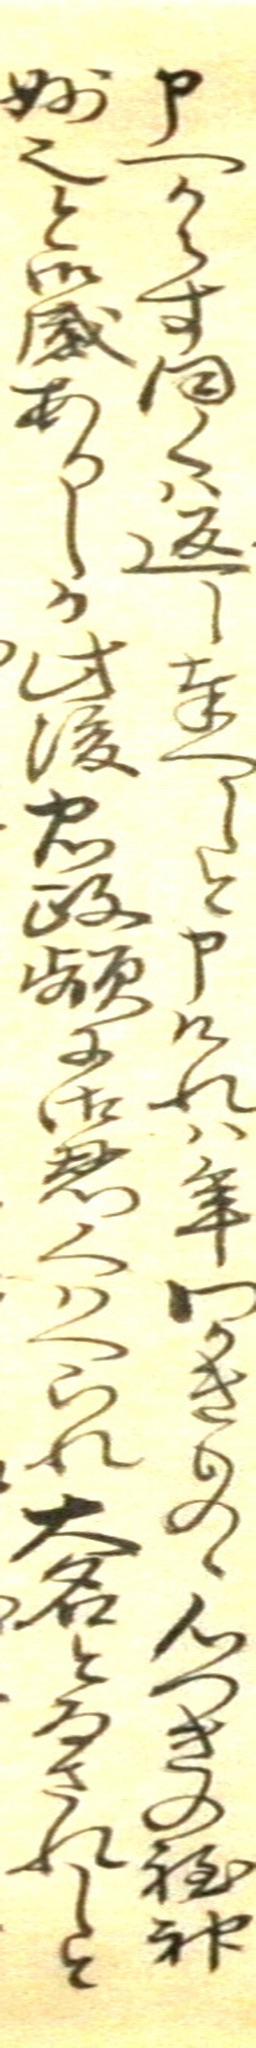妙也と御感ありしか此後忠政頻に御恩くはへられ大名となされしと
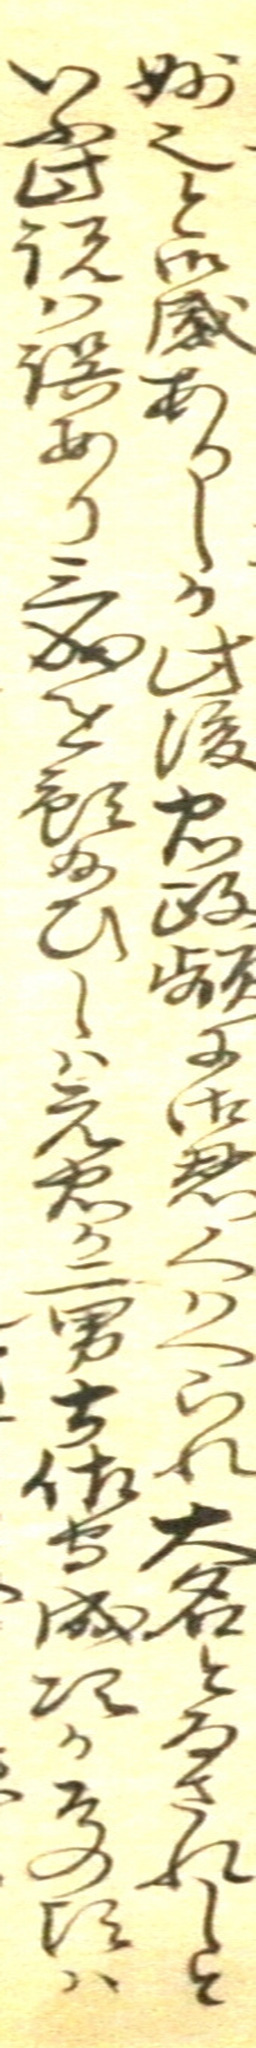いふ此説は誤あり三成を預給ひしは元忠か二男土佐守成次かその頃は
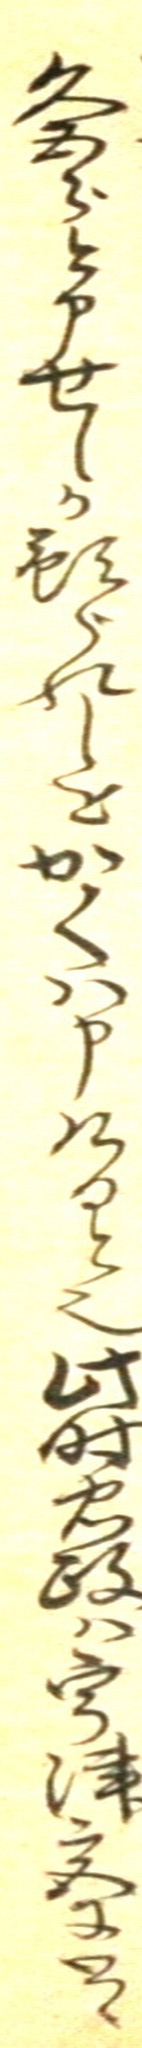久五郎と申せしか預られしをかくは申けると也此時忠政は宇津宮にとゝ
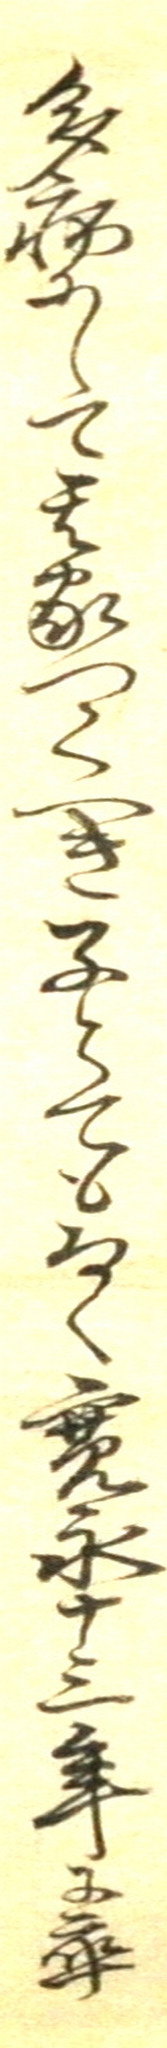多病にして其家つくへき子とてもなく寛永十三年に卒
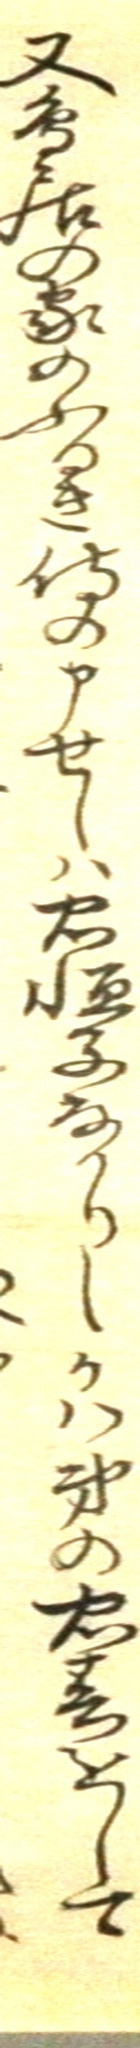又鳥居の家のふるき侍の申せしは忠恒子なかりしかは弟の忠春をして
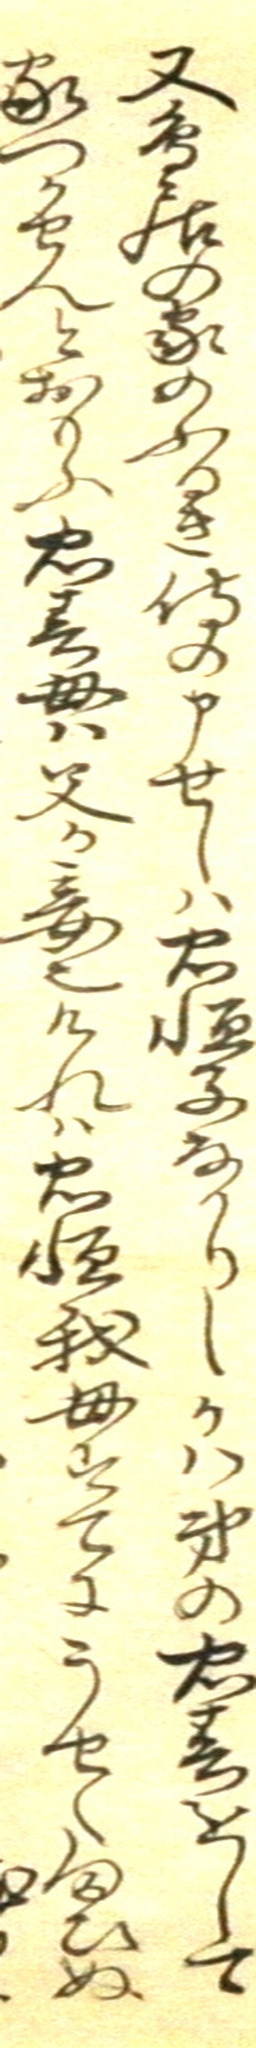家つかせんとおもふ忠春母は父か妾也けれは忠恒我母すてにうせたまひぬ
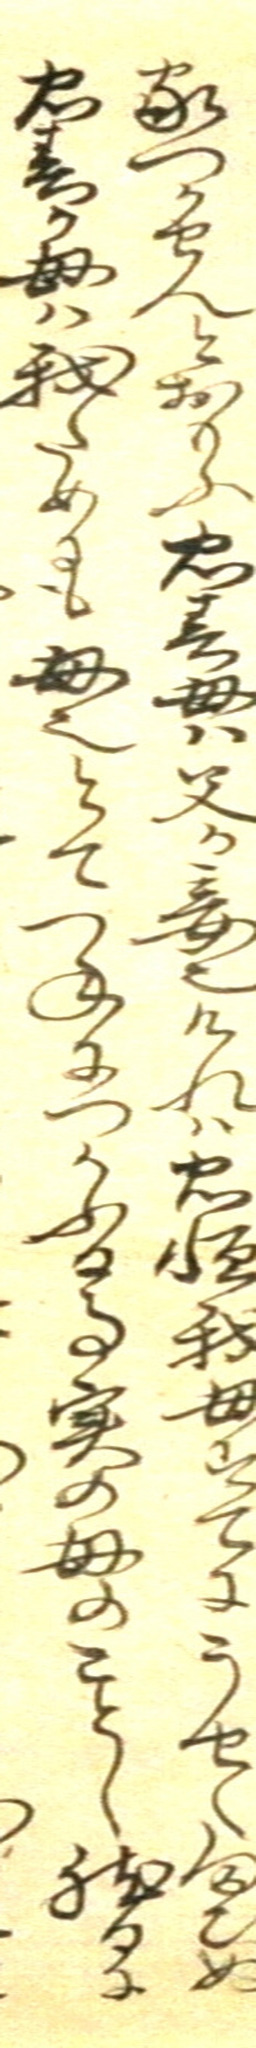忠春か母は我ためにも母也とてつねにつかふる事実の母のことし然るに
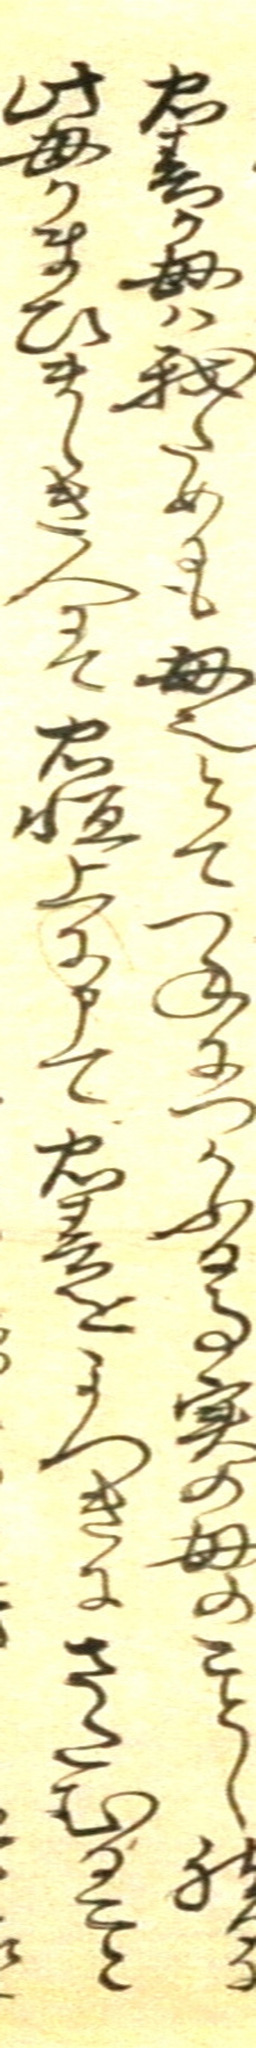此母かまひましき人にて忠恒上に申て忠春をよつきにさたむること
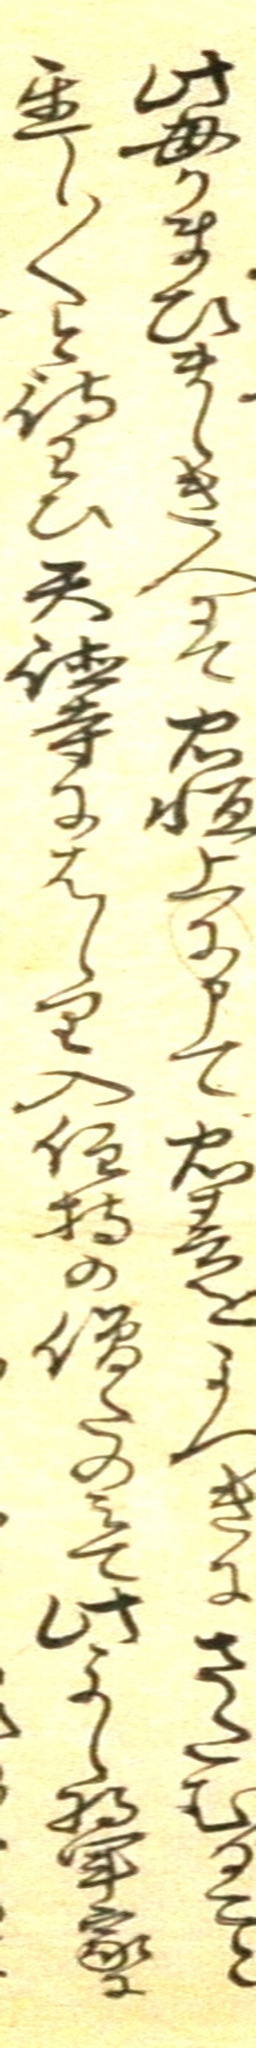遅し〳〵と待わひ天徳寺にはしり入住持の僧たのみて此よし将軍家に
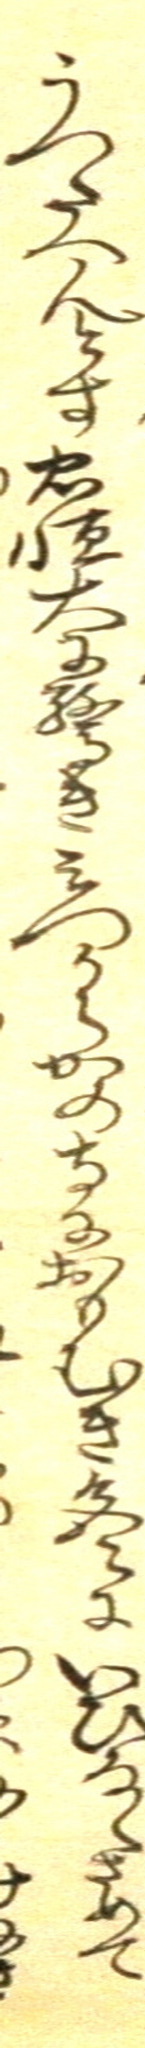うつたへんとす忠恒大に驚きみつからかの寺におもむき色々にいひなくさめて
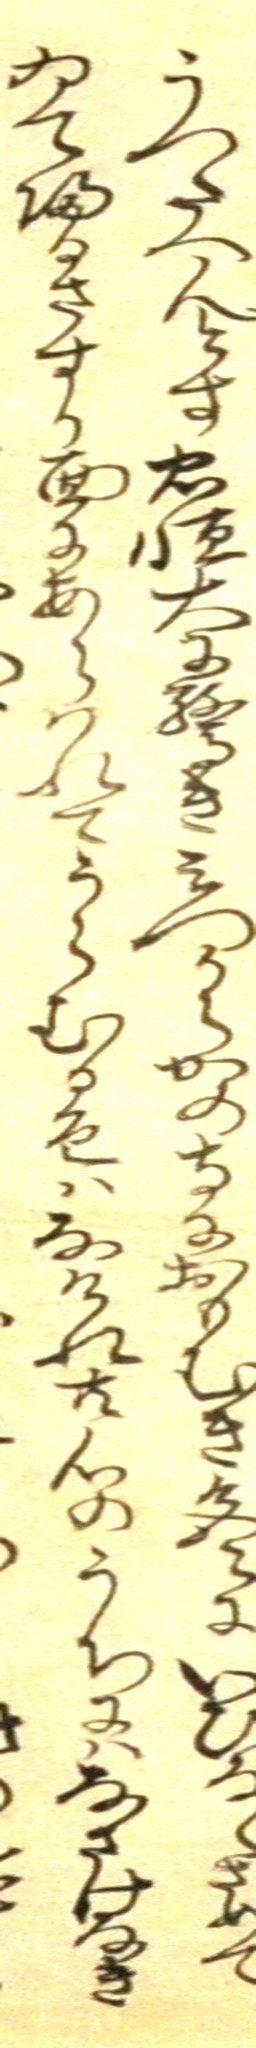ゐて帰るさすか面にあらはれてうらむる色はなけれ共心のうちにはなさけなき
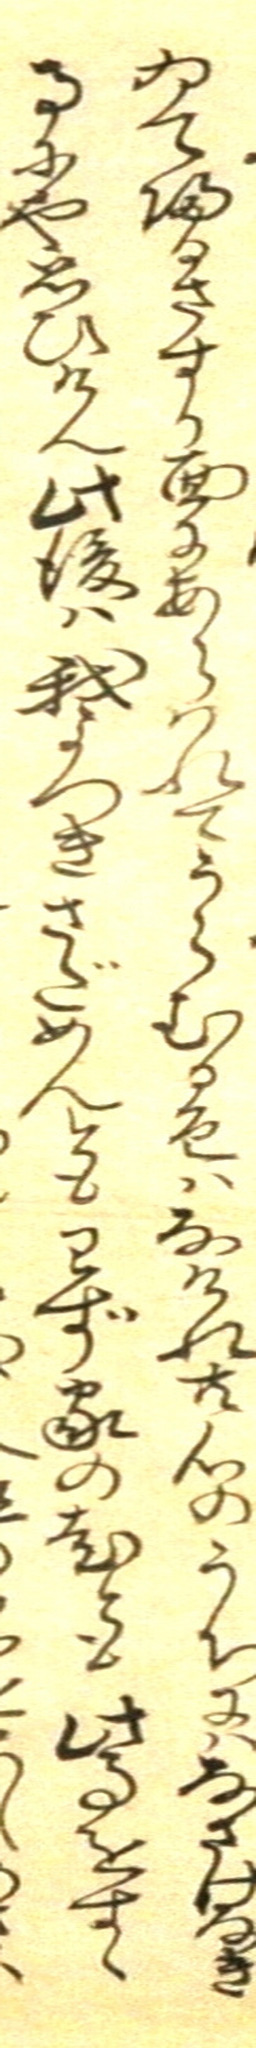事にや思ひけん此後は我よつきさだめんともわず家の老とも此事をすゝ
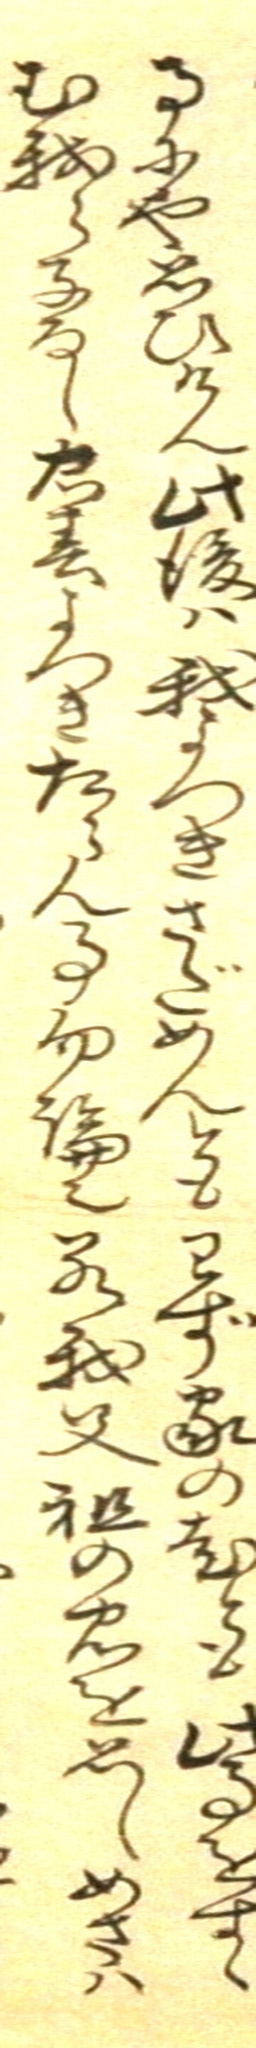む我ら子なし忠春よつきたらん事勿論也若我父祖の忠を思しめさは
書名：藩翰譜（四・中）
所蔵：伊那市立高遠町図書館・合同会社AMANE
